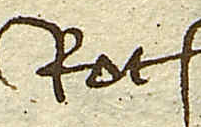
Rot*
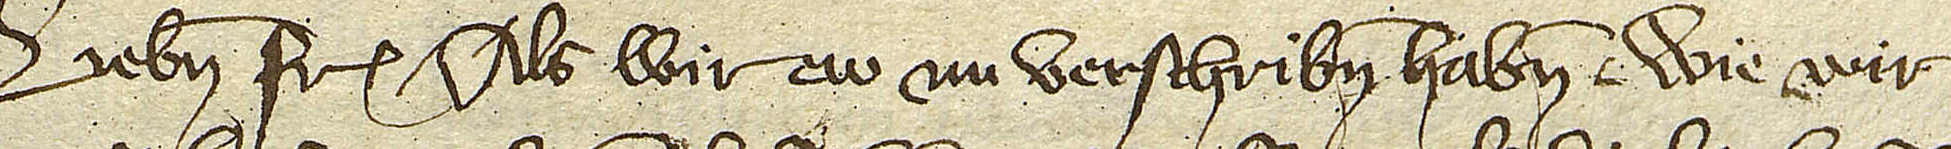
Liebn* fr* / Als wir ew nu verſchribn* habn* / Wie wir
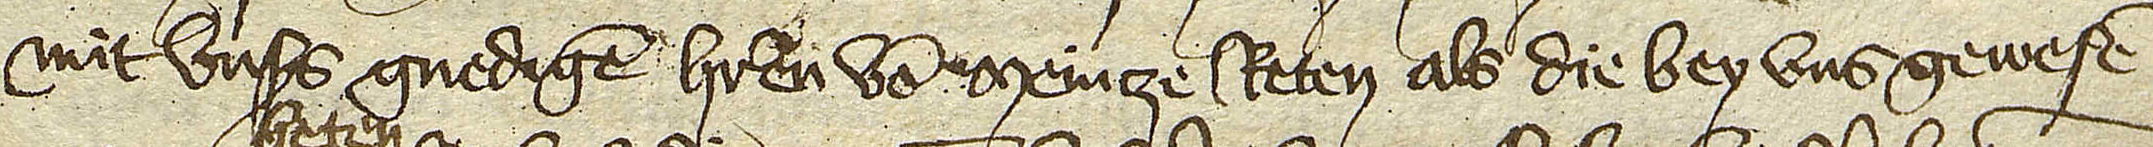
mit vnſ*s gnedige* hr*en vo* Meincʒe Reten als die bey vns geweſe*
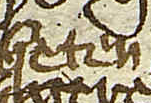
heten
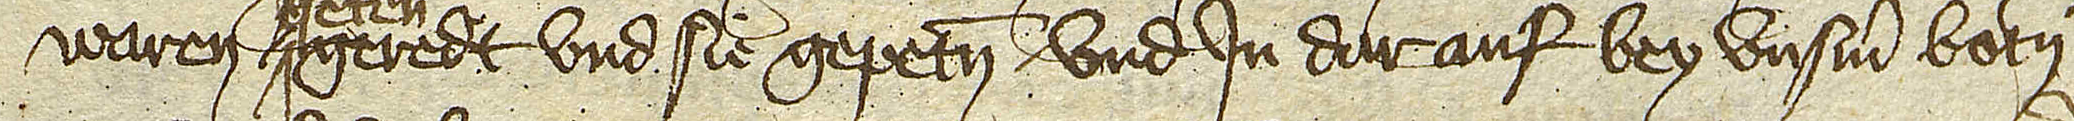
waren / geredt vnd ſie gepetn* / vnd In dar auf bey vnſm* botn*
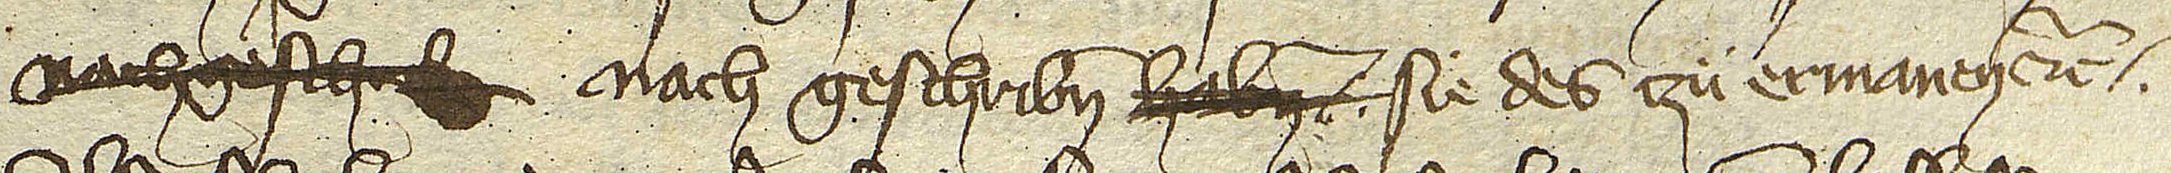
nach geſchribn nach geſchribn* habn* / . ſie des cʒü ermanen ec* / .
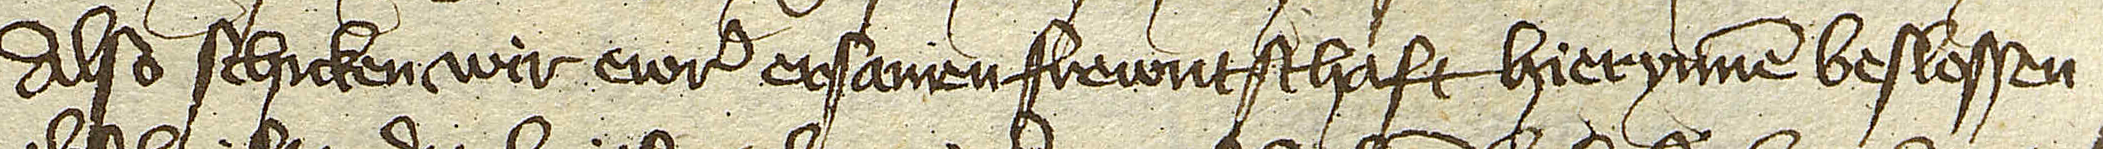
Alſo ſchicken wir ewr* erſamen frewntſchaft hierynne* beſloſſen
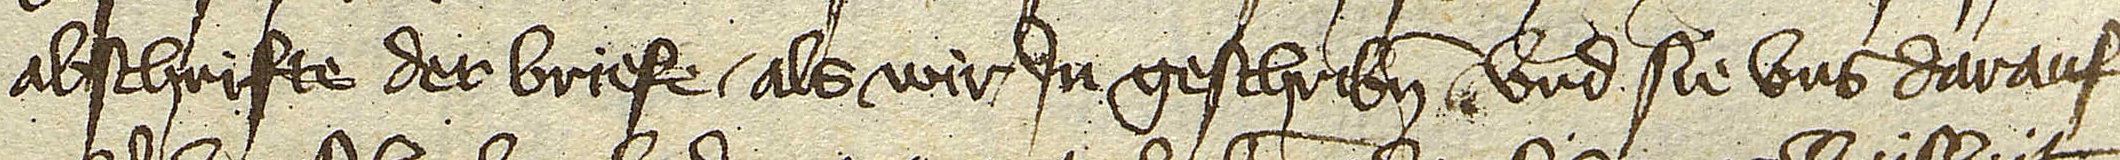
abſchrifte der briefe / als wir In geſchribn* / vnd ſie vns darauf
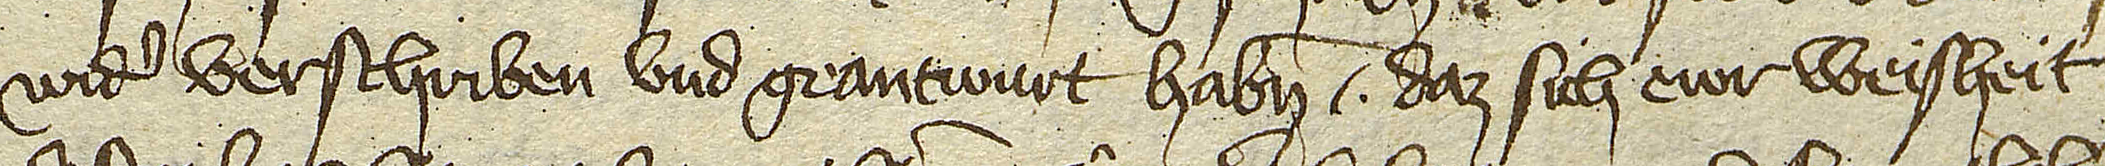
wid* verſchriben vnd geantwurt habn* / . daʒ ſich ewr weiſheit
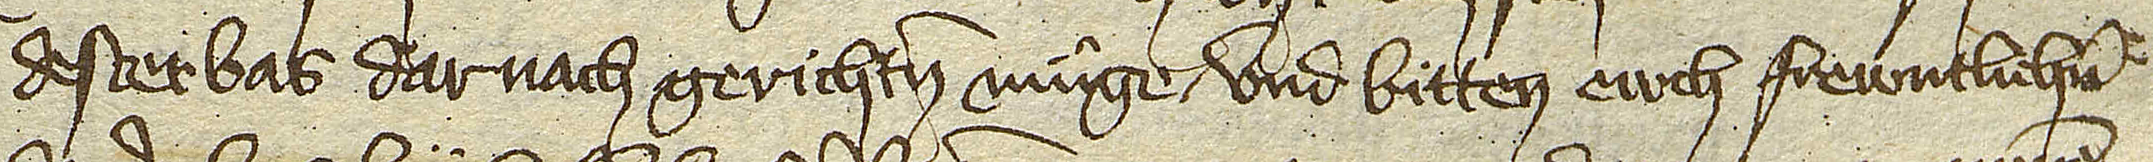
deſter bas dar nach gerichtn* müge / vnd bitten ewch frewntlichn*
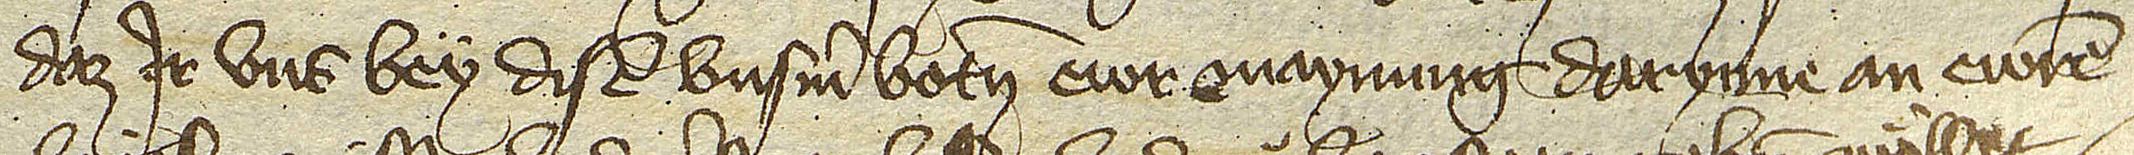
daʒ Ir vns bey diſe* vnſm* botn* ewr maynung darynne an ewre*
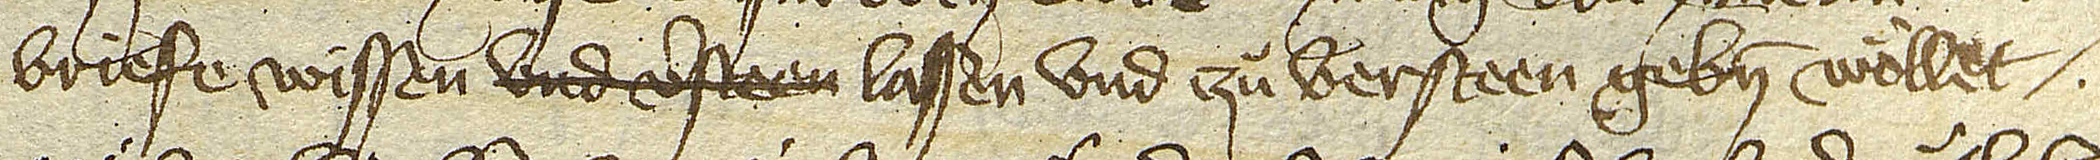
briefe wiſſen vnd v*ſteen laſſen vnd cʒü verſteen gebn* wöllet / .
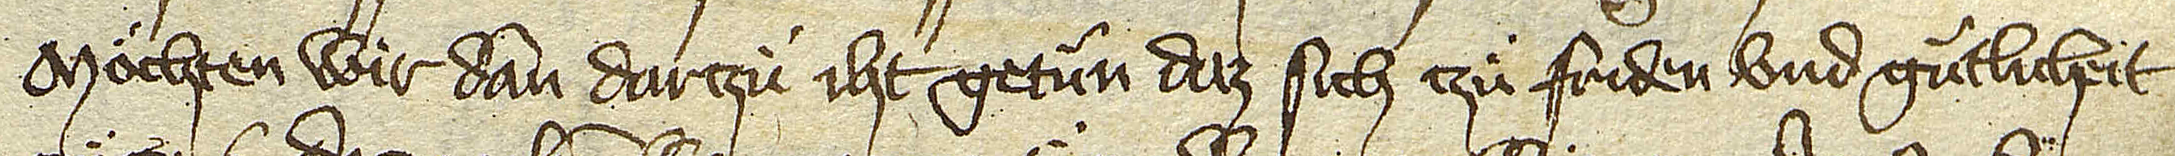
Möchten wir dan* darcʒü iht getün daʒ ſich cʒü friden vnd gütlicheit
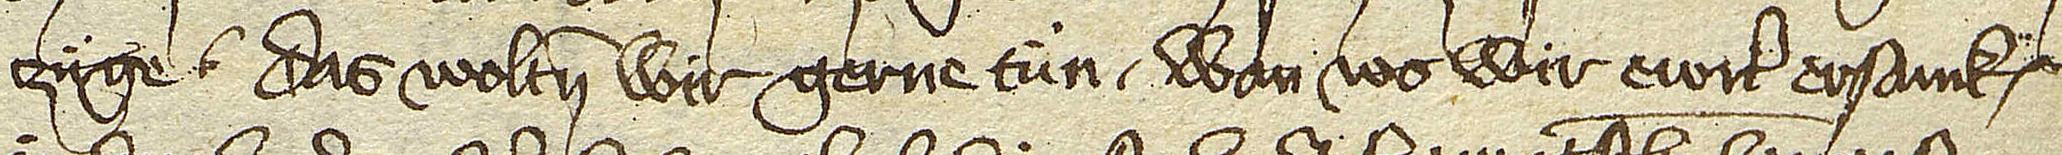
cʒüge / . Das woltn* wir gerne tün / wan wo wir ewr* erſamk*
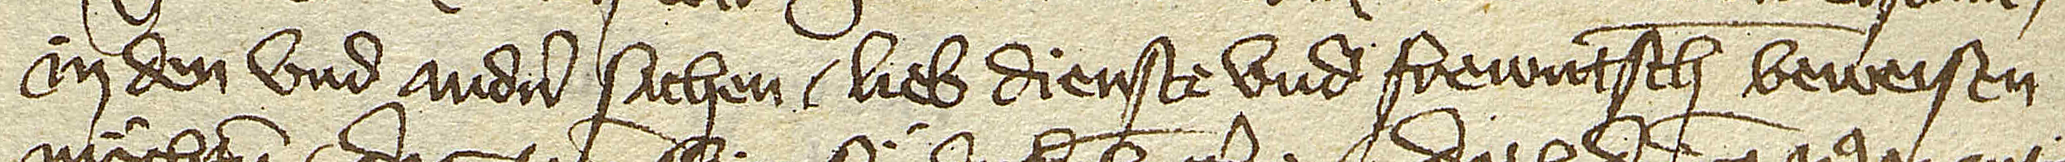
in den vnd andn* ſachen / lieb dienſte vnd frewntſch beweiſen
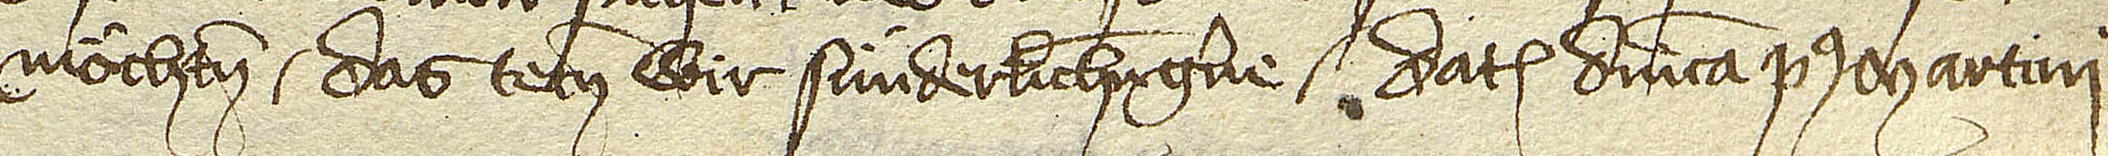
möchtn* / Das tetn* wir ſünderlichn* g*ne / Dat* dnica p* Martini .
